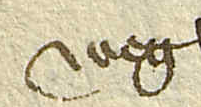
weg*
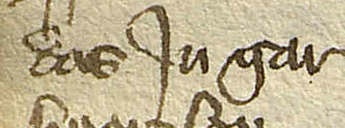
das In gar
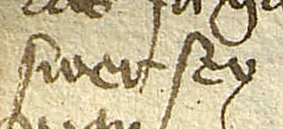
ſwer ſey
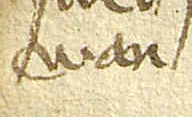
wan
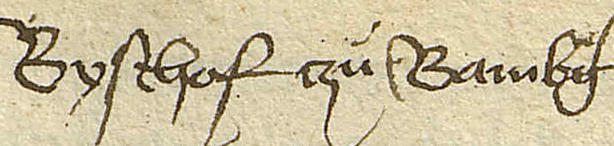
Byſchof cʒü Bambg*
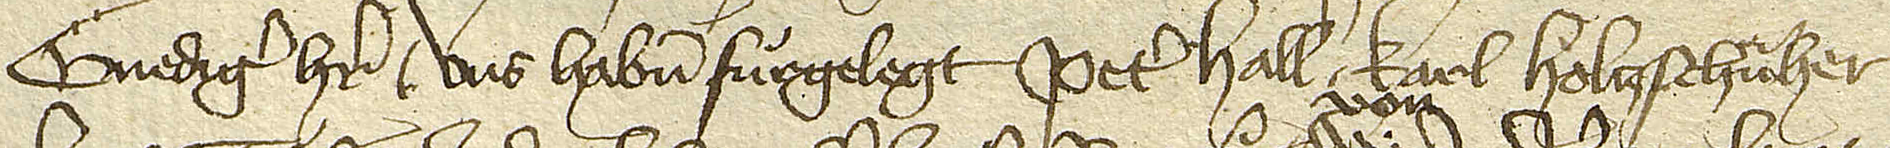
Gnedig* hr* / Vns habn* fürgelegt Pet* hall* / Karl holcʒſchüher
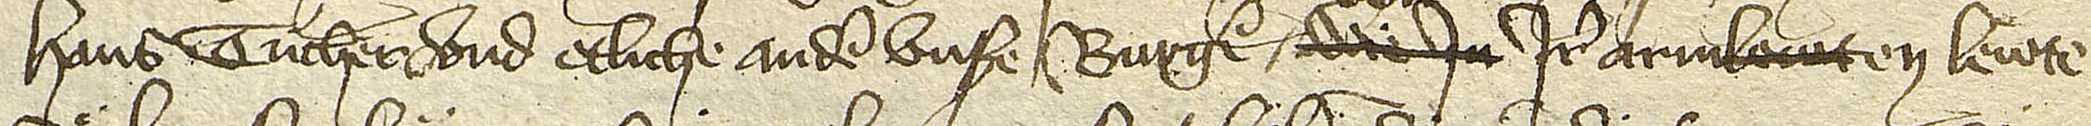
hans Tücher / vnd etliche and* vnſ*e Burge* / Wie In Ir* armlewten lewte
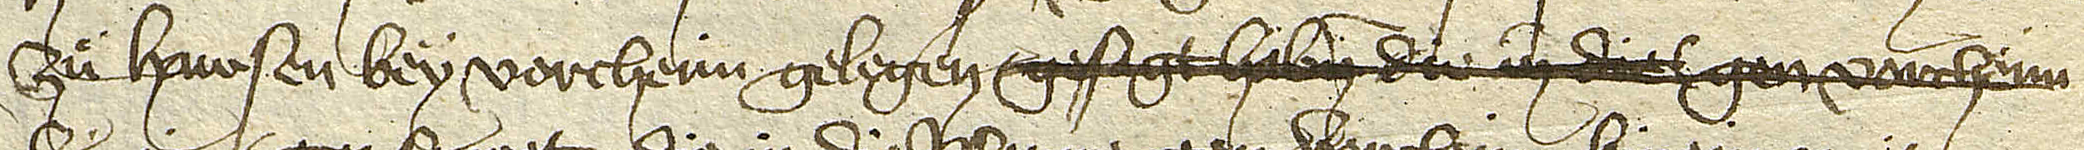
cʒü hawſen bey vorcheim gelegen geſagt habn* die in* di% gen vorcheim
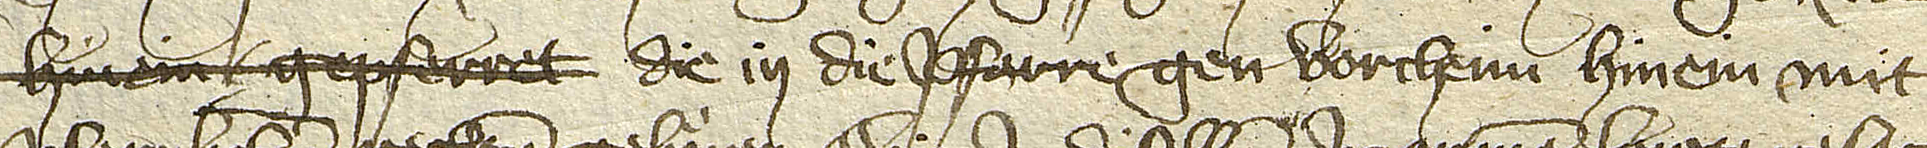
hinein / gepferrt die in die pfarre gen vorcheim hinein mit
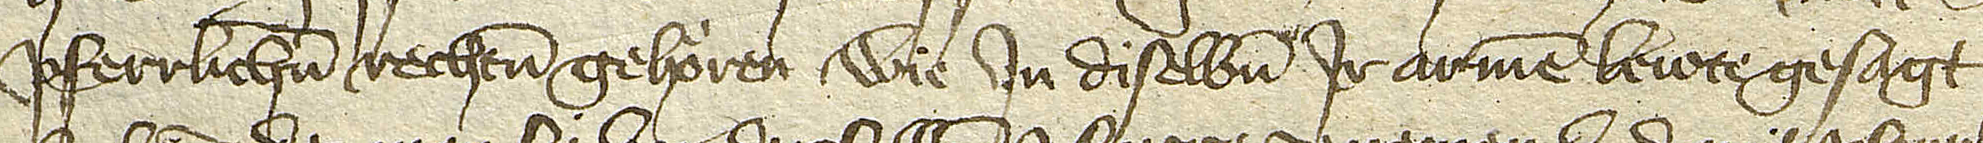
pferrlichn* rechtn* gehören / wie In diſelbn* Ir arme* lewte geſagt
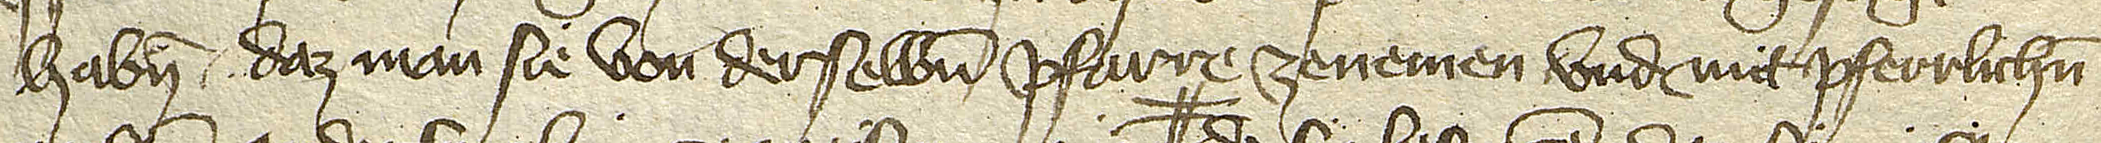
habn* / daʒ man ſie von derſelbn* pfarre cʒenemen vnd mit pferrlichn*
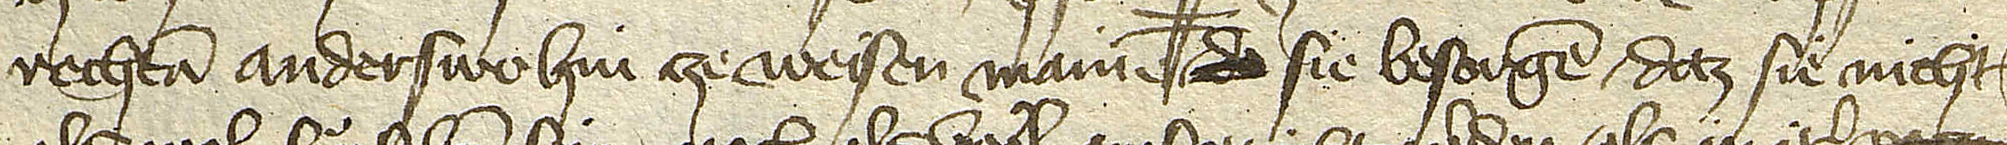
rechtn* anderſwo hin cʒe weiſen maine / do ſie beſorge* / daʒ ſie nicht
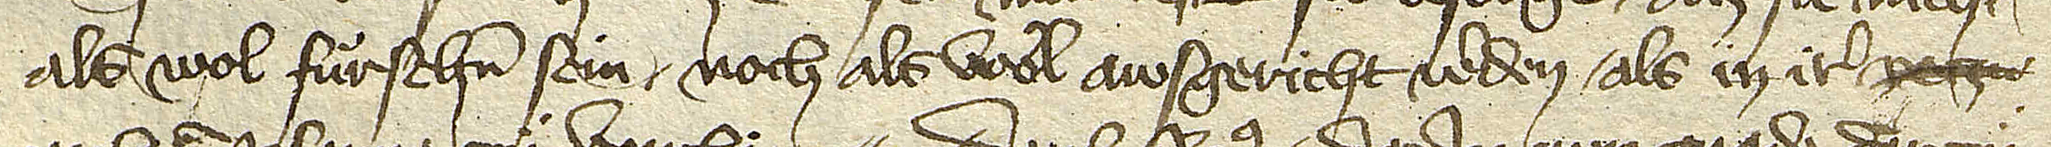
als wol fürſehn* ſein / noch als wol awſgericht w*dn / als in ir* yecʒu
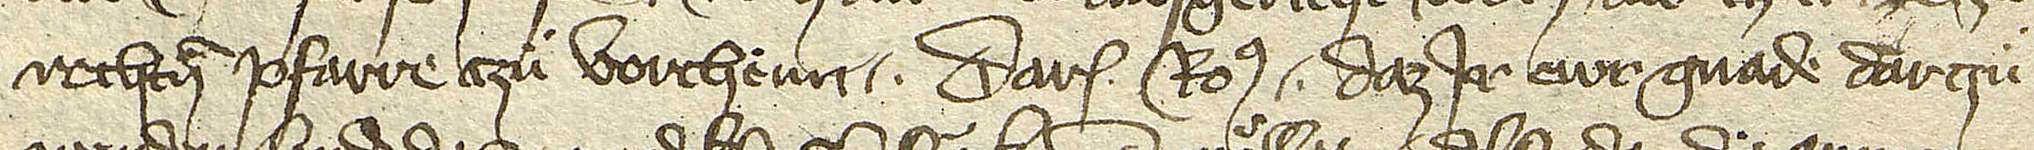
rechtn* pfarre cʒü vorcheim / . Dar* Ro* / . daʒ Ir ewr gnade darcʒü
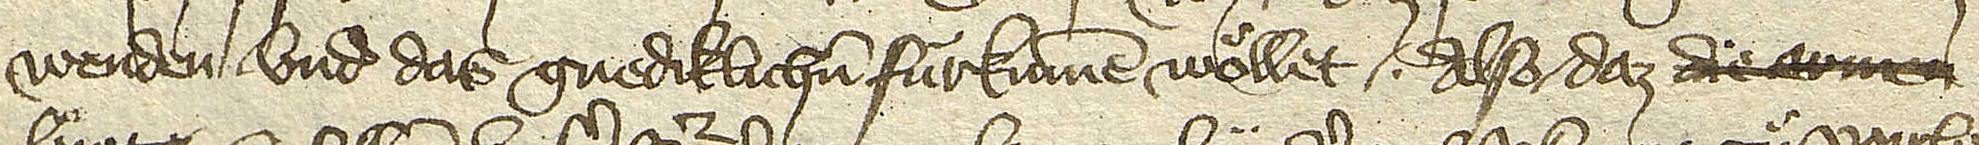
wenden / vnd das gnediklichn* fürkume* wöllet / . Alſo / daʒ die armen
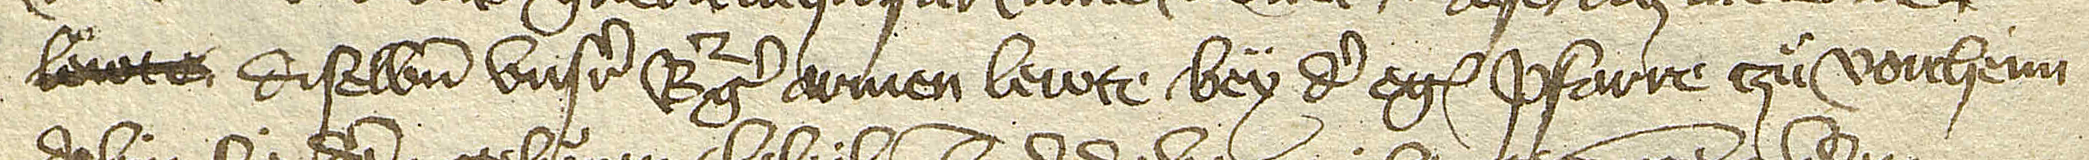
lewte diſelbn* vnſr* B*g* armen lewte / bey d* eg* Pfarre cʒü vorcheim
